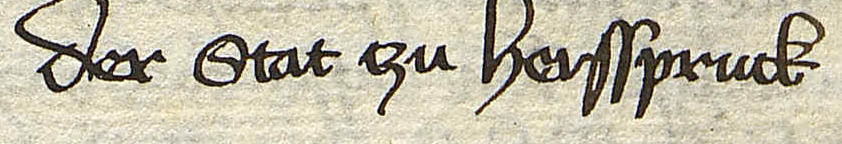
der stat cʒu herſſpruck
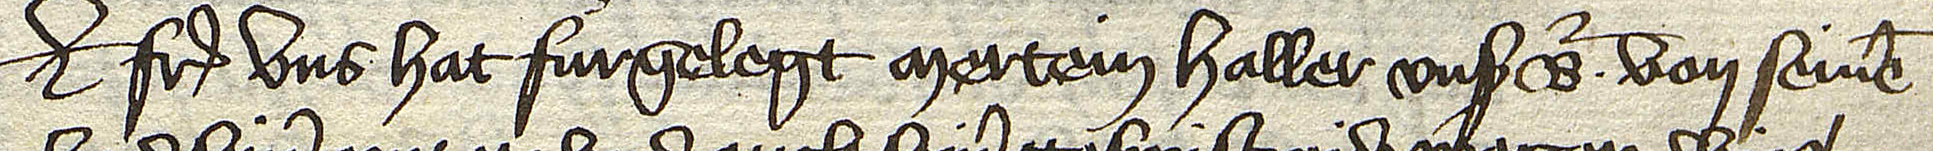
L* fr* vns hat furgelegt Mertein haller vnſ* B* . von ſeine*
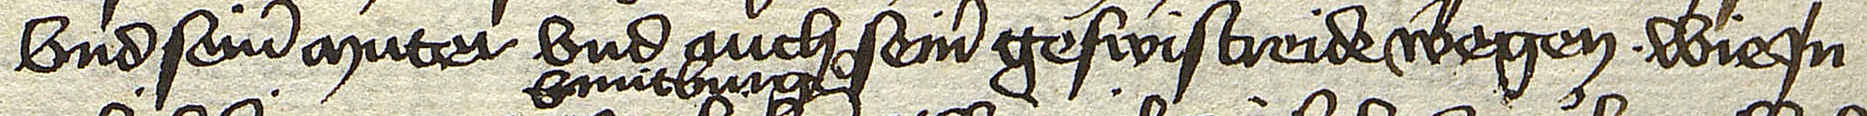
vnd ſein* Muter vnd auch ſein* geſwiſtreide wegen . wie In
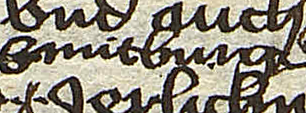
bmitburg*
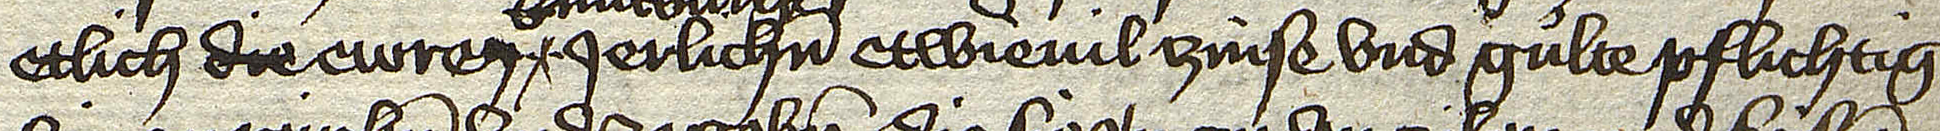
etlich die ewren Ierlich*n etwieuil cʒinſe vnd gülte pflichtig
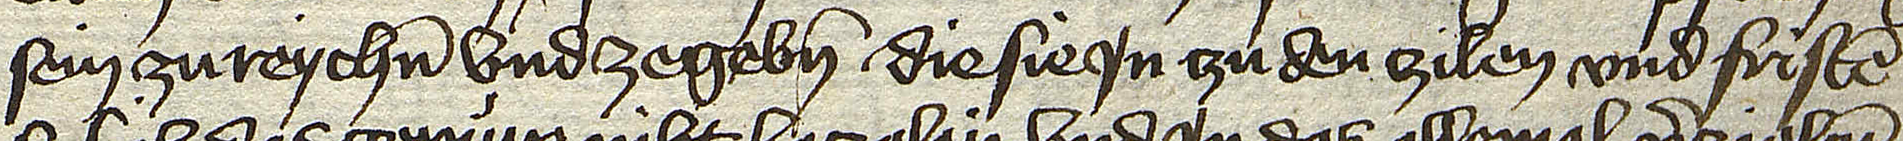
ſein ʒu reych*n vnd cʒegeb*n / die ſie In cʒu den cʒilen vnd friſte*
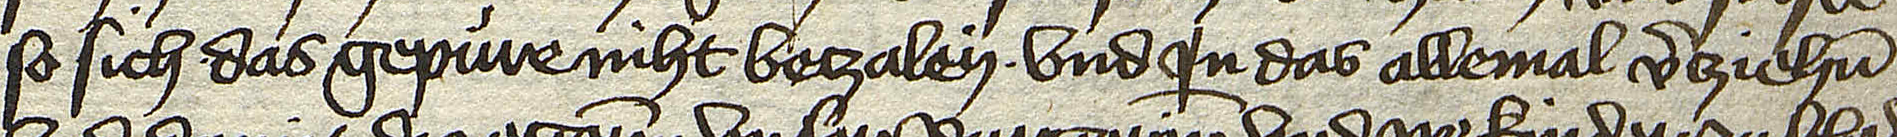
ſo ſich . das gepüre niht becʒalen . vnd In das allemal v*cʒiehn*
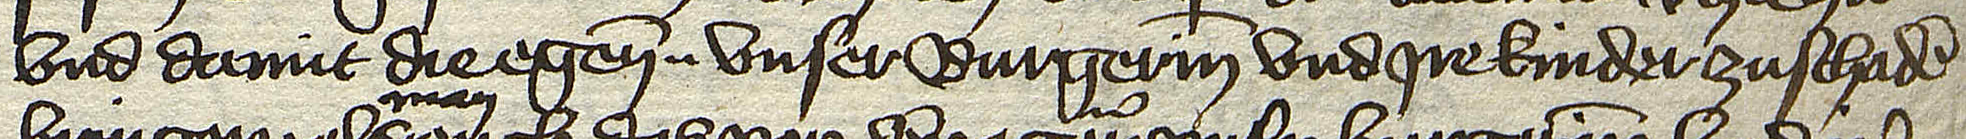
vnd damit die egen* ~ vnſer Burgerin* vnd Ire kinder cʒuſchad*
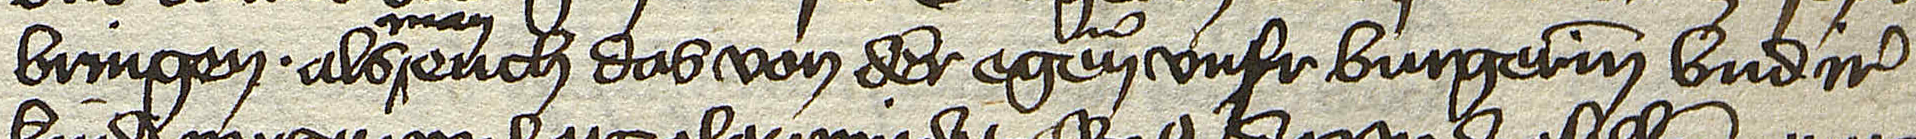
bringen . als euch das von der egen* vnſ*r burgerin* vnd ir*
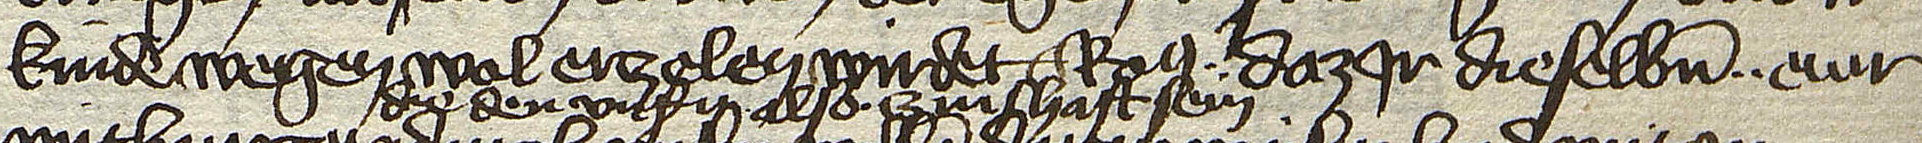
kinde wegen wol ercʒelen wirdet / Ro* ~ daʒ Ir dieſelb*n ~ ewr
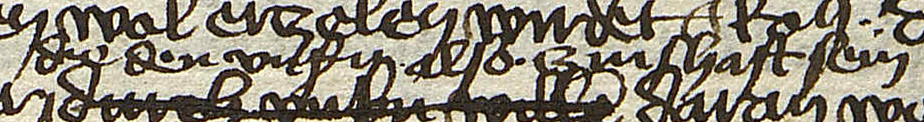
die den vnſ*n alſo cʒinſhaft ſeyn
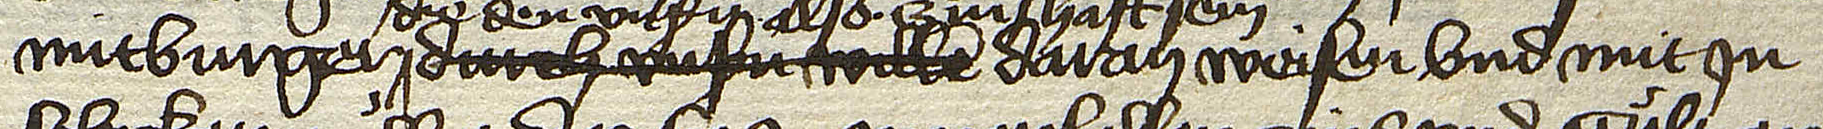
mitburger durch vnſ*n wille* daran weiſen vnd mit In
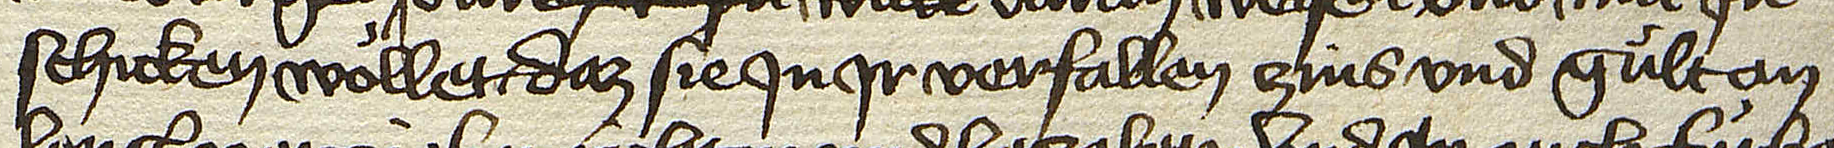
ſchicken wöllet / daʒ ſie In Ir verfallen cʒins vnd gült an
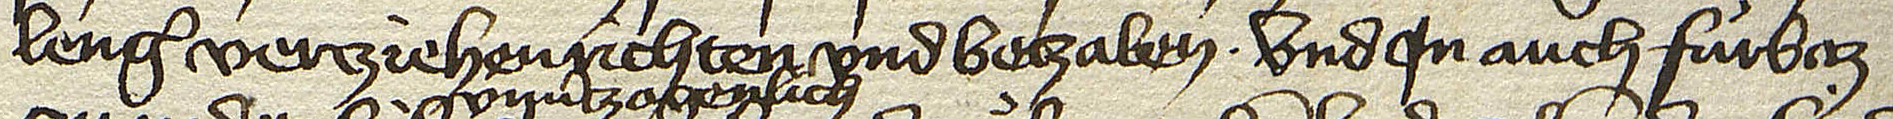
leng* vercʒiehen richten vnd becʒahlen . vnd In auch fürbaʒ
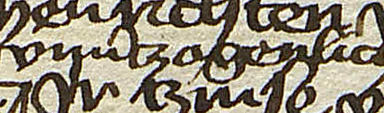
vnu*ʒogenlich
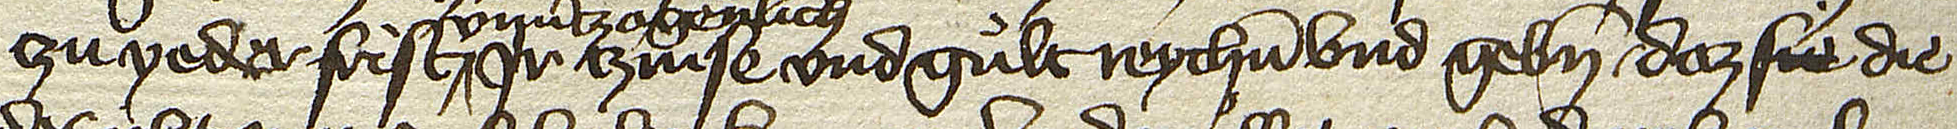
cʒu yeder friſt Ir cʒinſe vnd gült reych*n vnd geb*n / daʒ ſie die
